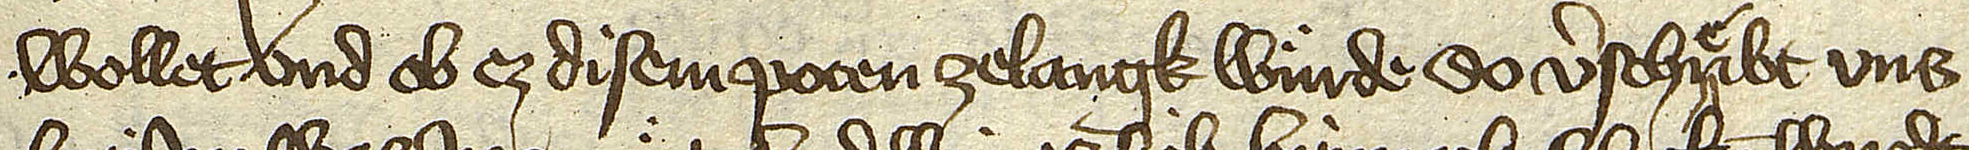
wollet vnd ob eʒ diſem poten cʒelangk würde So v*ſchribt vns
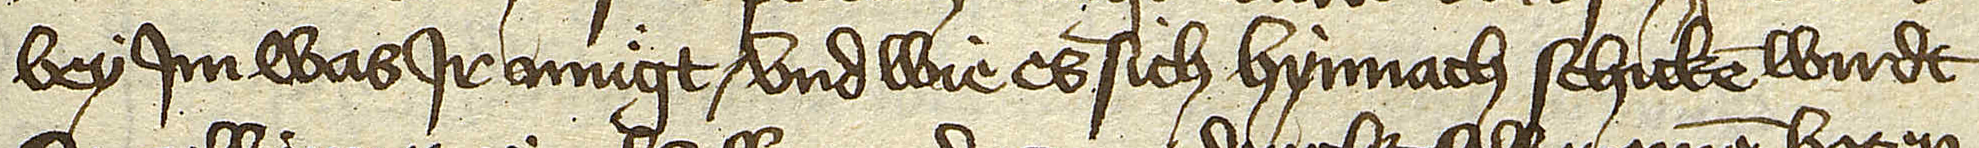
bey Im was Ir mügt / vnd wie es ſich hynnach ſchicke* wirdt
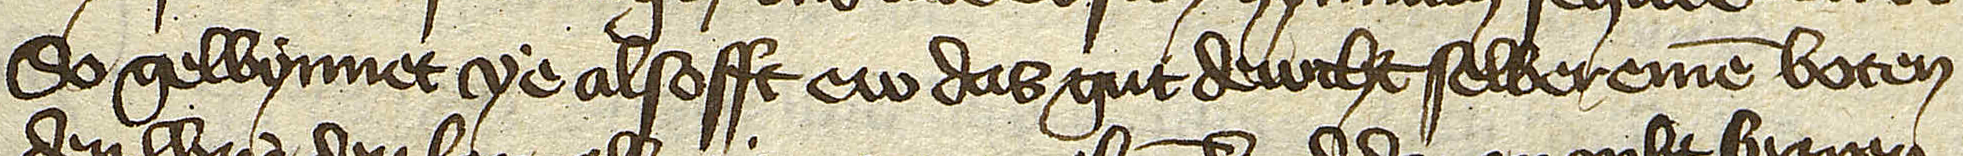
So gewynnet ye alſofft ew das gut dewcht ſelber eine* boten
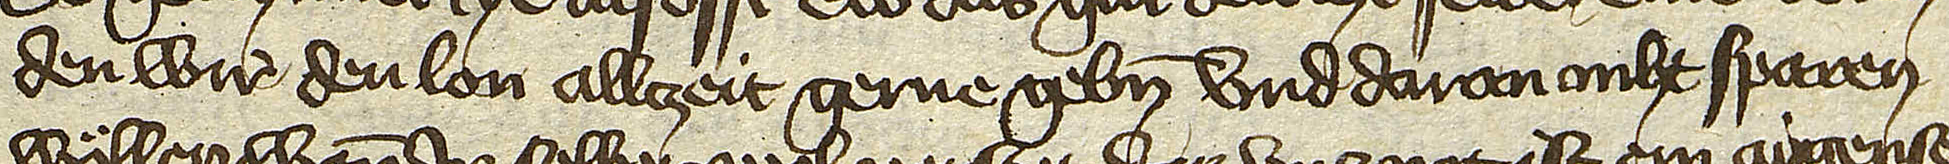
den wir den lon allcʒeit gerne gebn* vnd daran niht ſparen
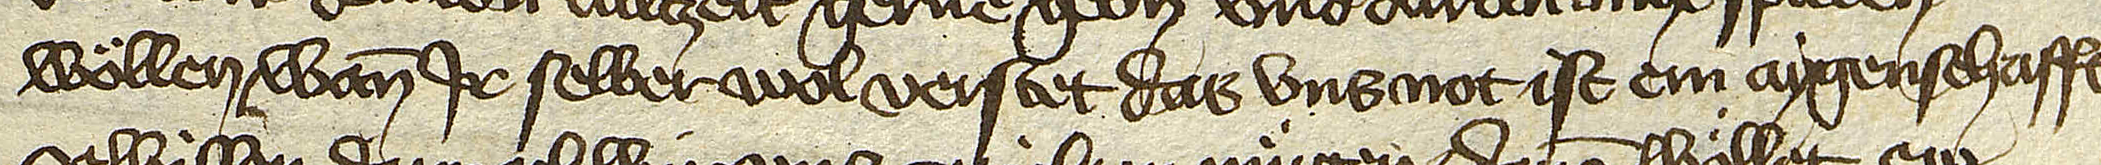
wöllen / wan* Ir ſelber wol verſtet das vns not iſt ein aygenſchafft
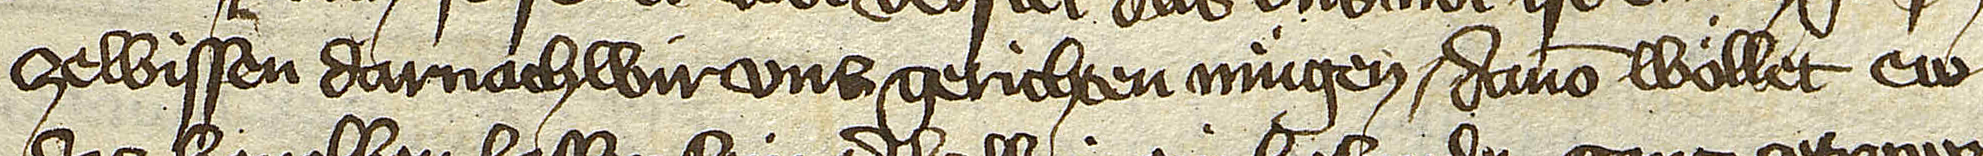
cʒewiſſen darnach wir vns gerichten mügen / dauo* wöllet ew
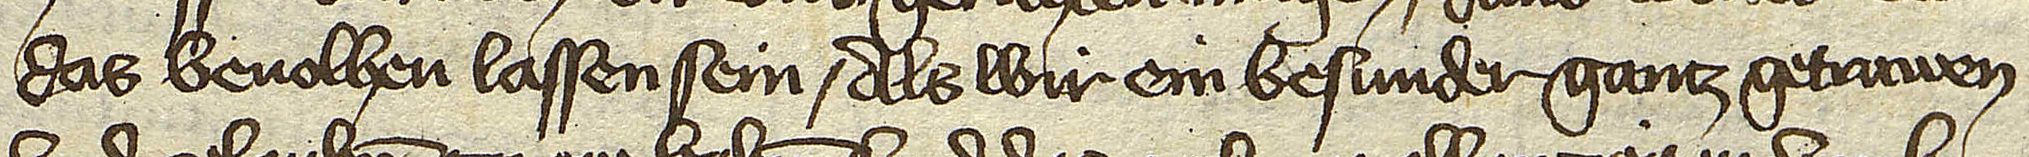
das beuolhen laſſen ſein / Als wir ein beſunder gancʒ getrawen
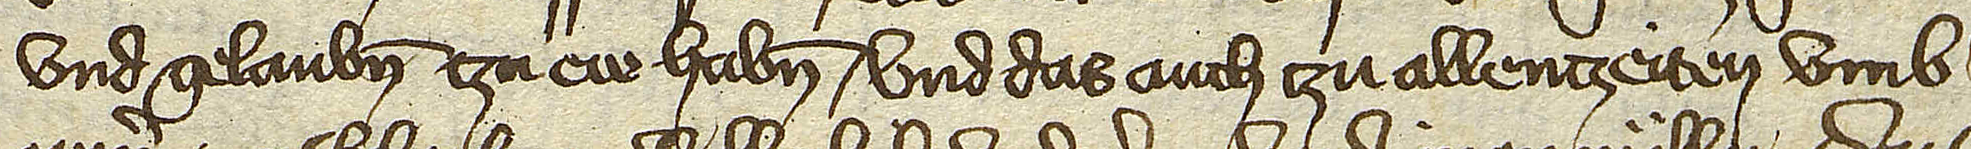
vnd gelaubn* cʒu ew habn* / vnd das auch cʒu allencʒeiten vmb
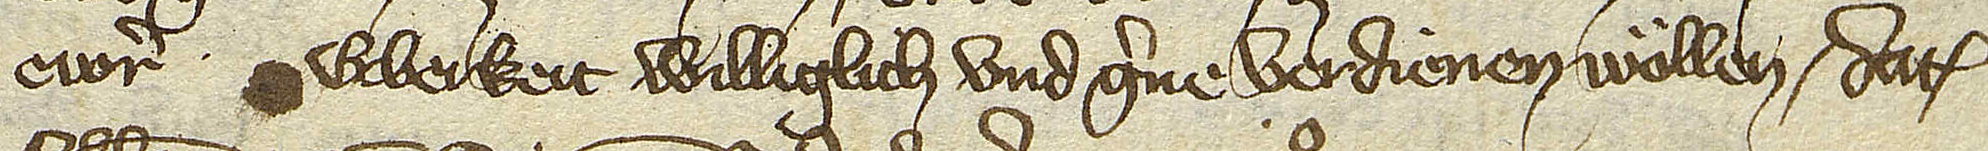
ewr* Erberkeit williglich vnd g*ne verdienen wöllen / dat*
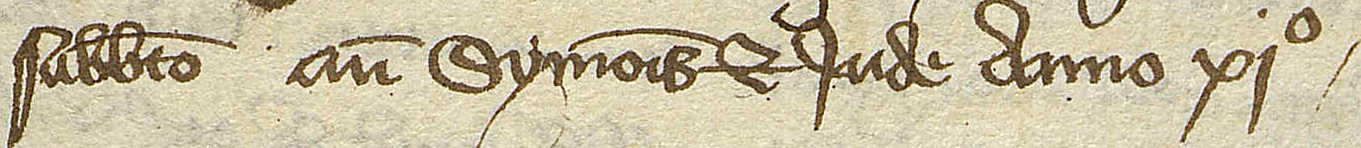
ſabbto* an* Symois @ Iude Anno xi* /
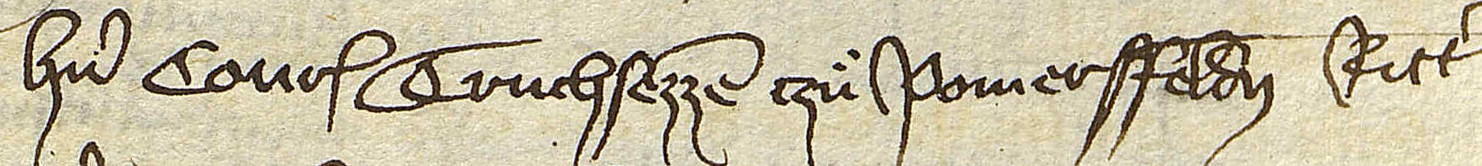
hn* Conr* Truchſeʒʒe* cʒü Pomerſfeldn* Ritt*
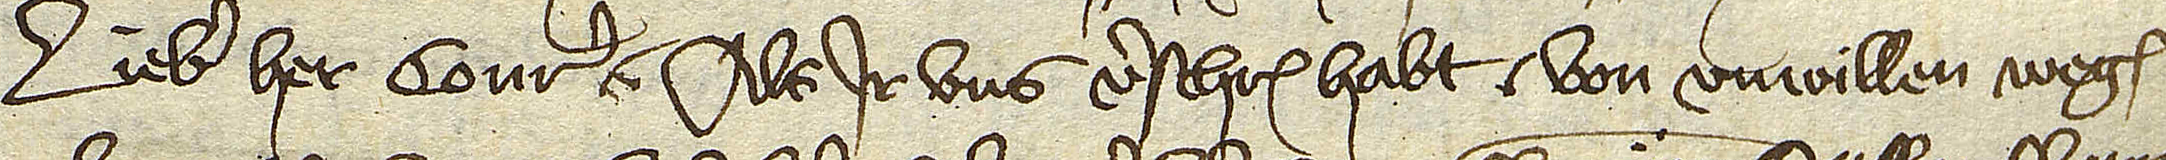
Lieb* her Conr* / Als Ir vns v*ſchr* habt / von vnwillen weg*
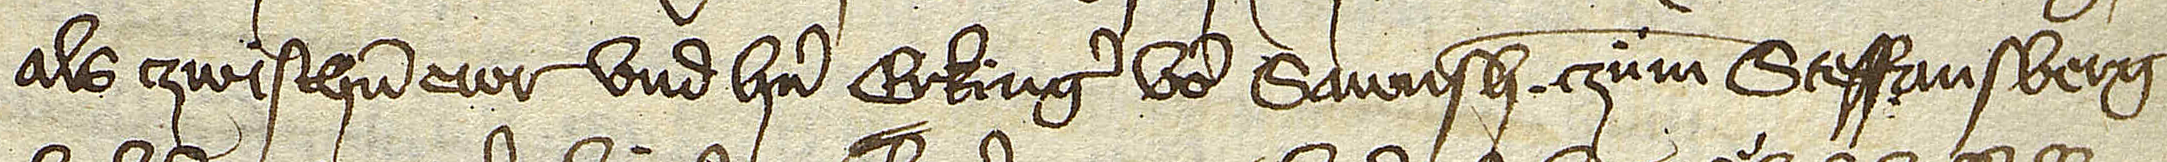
als cʒwiſchn* ewr vnd hn* Erking* vo* Sawnſh* . cʒüm Steffanſberg
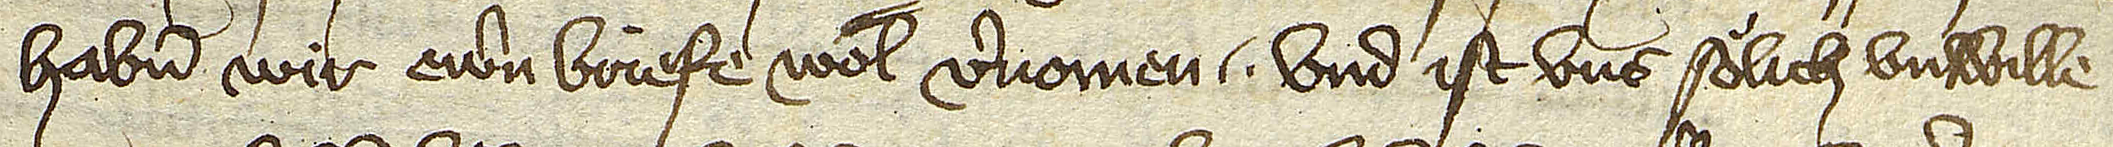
habn* wir ew*n briefe wol v*nomen / . vnd iſt vns ſölich vnwille
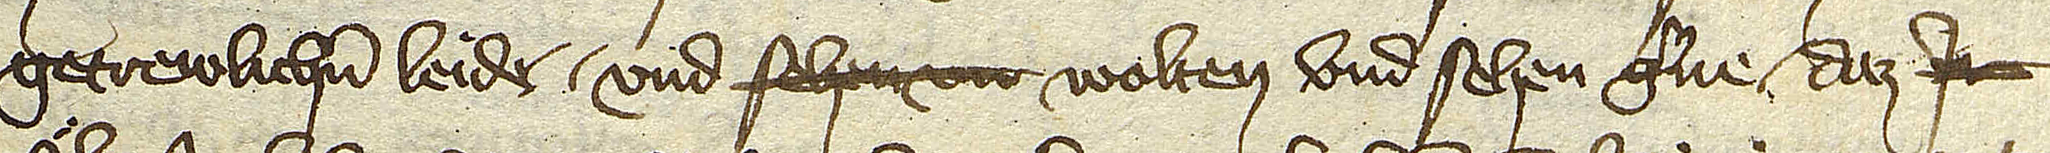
gerewlichn* leide / . vnd ſehen vn wolten vnd ſehen g*ne / daʒ Ir
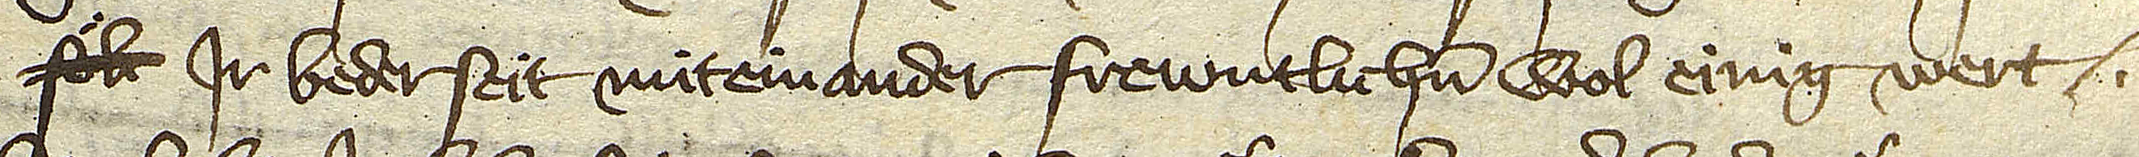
ſöli Ir beder ſeit miteinander frewntlichn* wol einig wert / .
